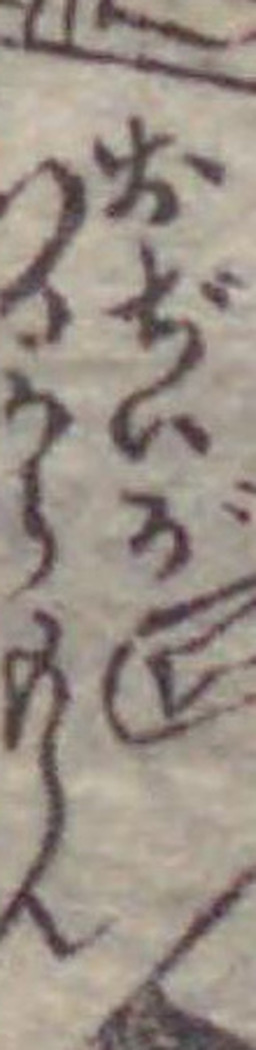いるからもゝん
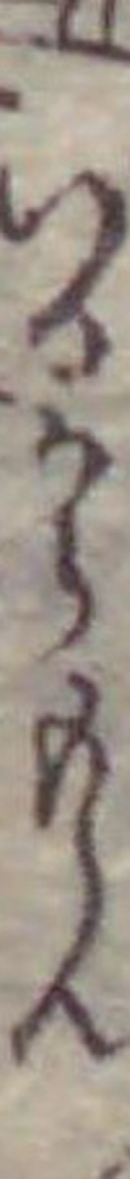いるからもゝん
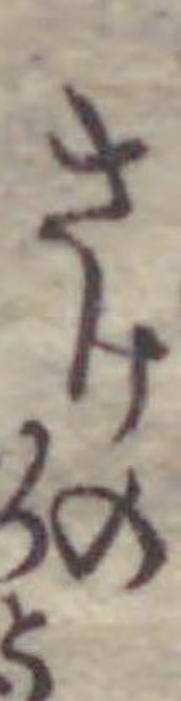さけの
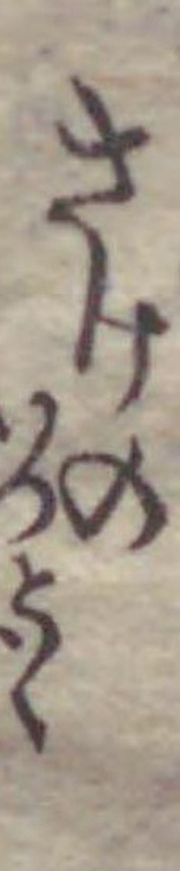さけの
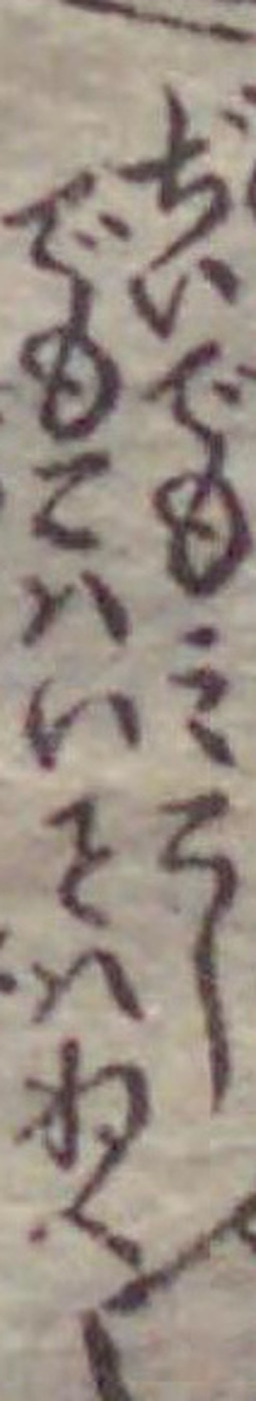でもこはいことはねへ
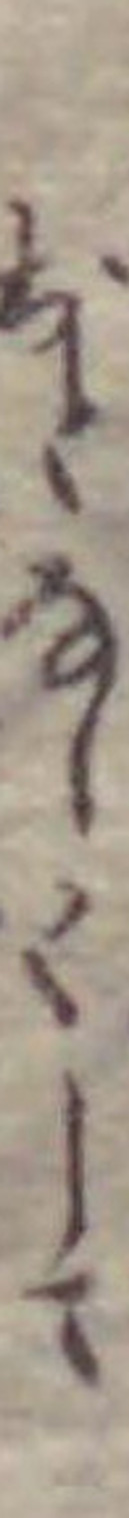おとなしくして
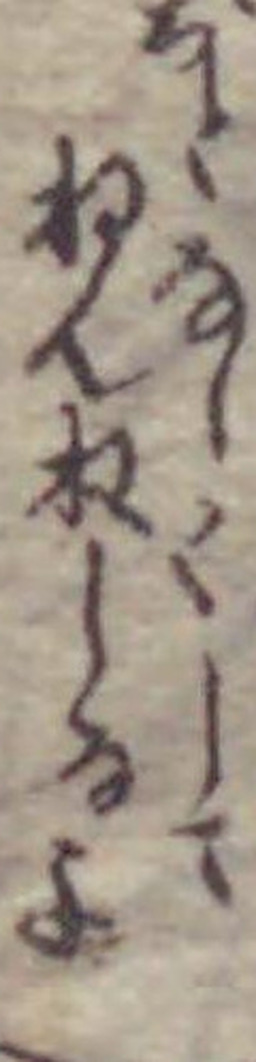ねんねしなよ
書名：化物見世開 : 2巻
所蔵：国立国会図書館 National Diet Library, JAPAN
